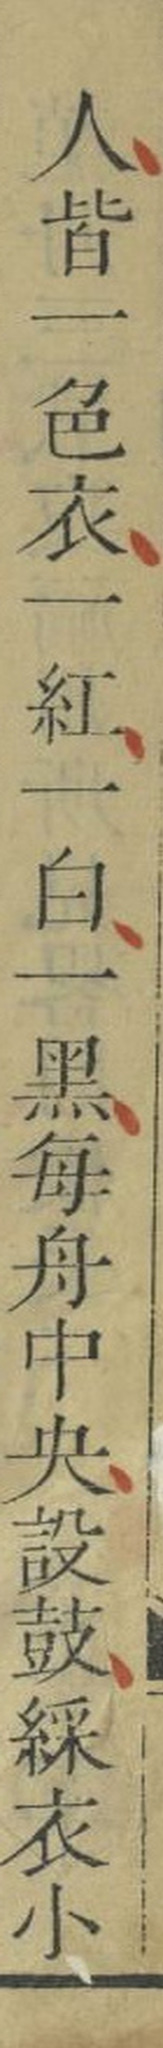人皆一色衣一紅一白一黑每舟中央設鼓綵衣小
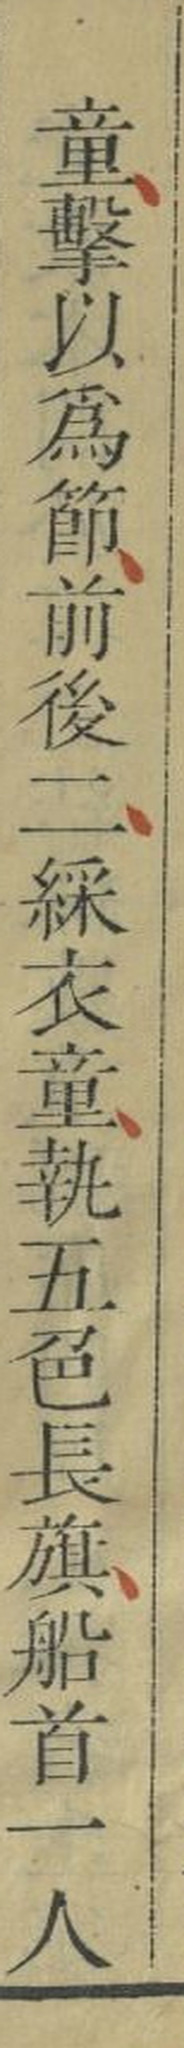童擊以爲節前後二綵衣童執五色長旗船首一人
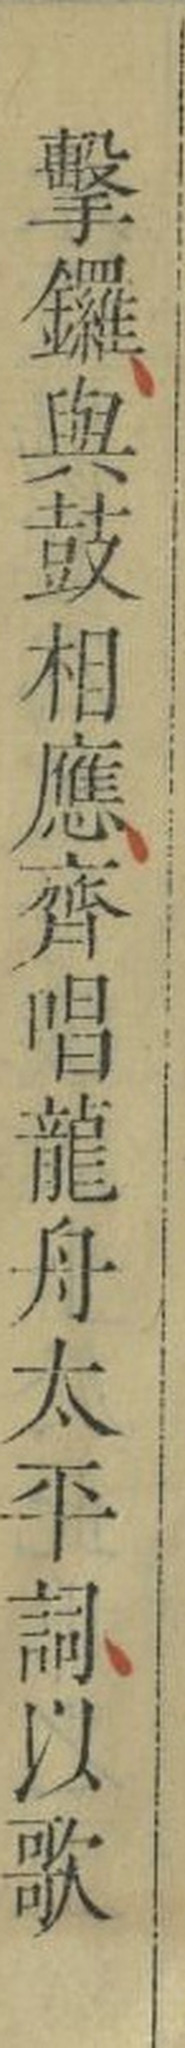擊鑼與鼓相應齊唱龍舟太平詞以歌
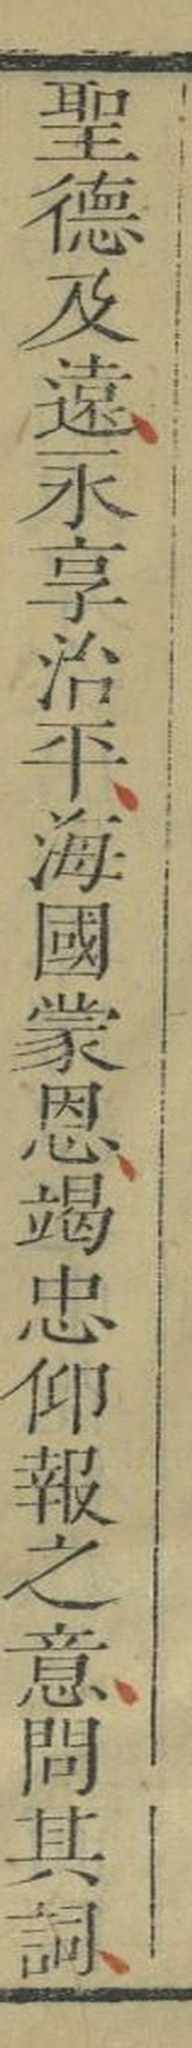聖德及遠永享治平海國蒙恩竭忠仰報之意問其詞
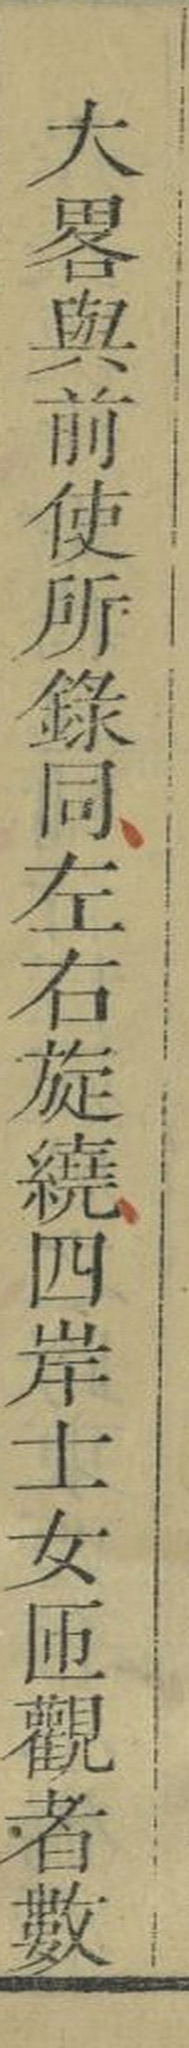大畧與前使所錄同左右旋繞四岸士女匝觀者數
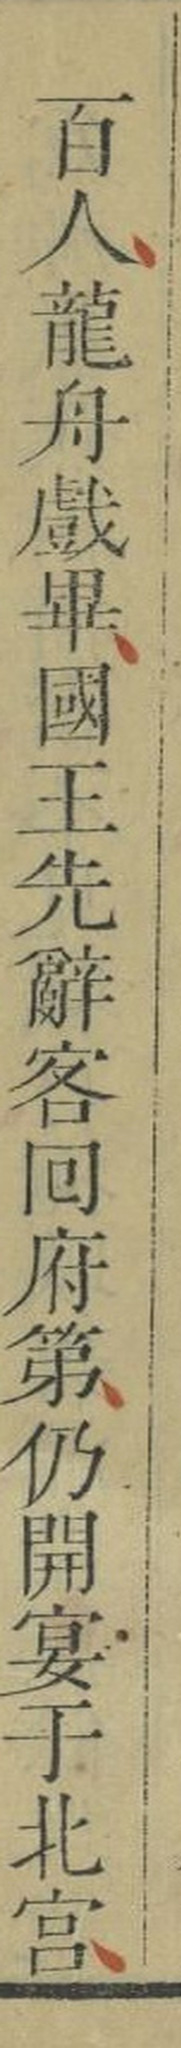百人龍舟戲畢國王先辭客囘府第仍開宴于北宫
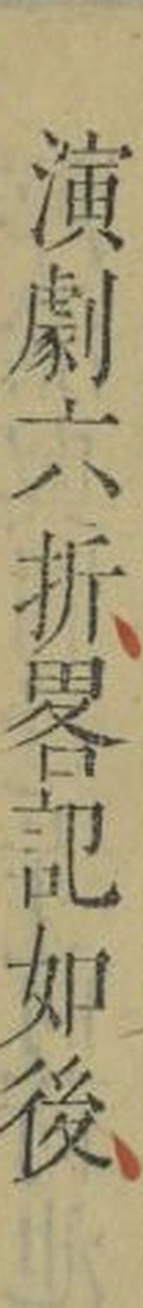演劇六折畧記如後
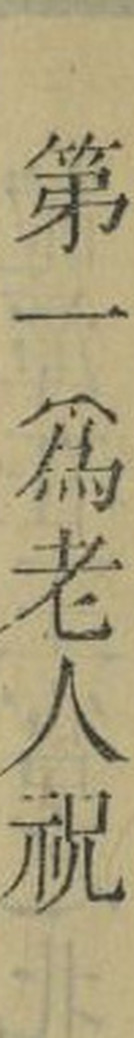第一爲老人祝
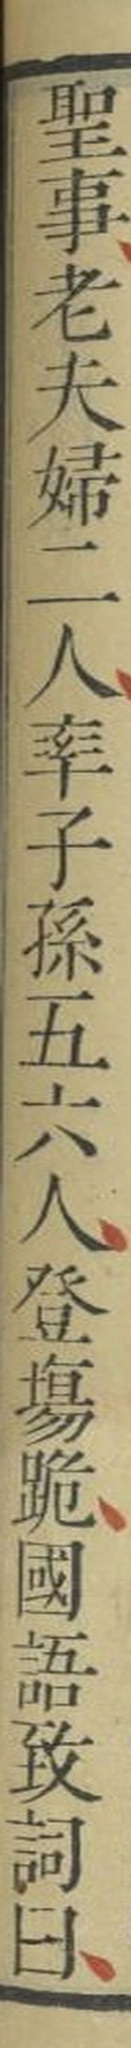聖事老夫婦二人率子孫五六人登塲跪國語致詞曰
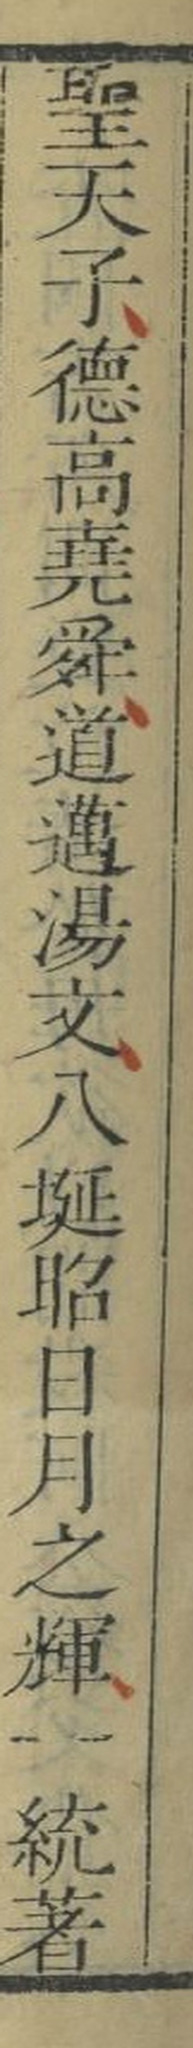聖天子德高堯舜道邁湯文八埏昭日月之輝一統著
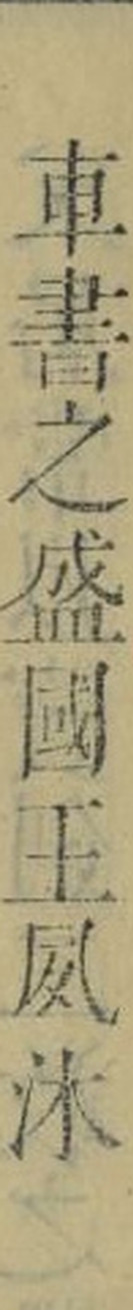車書之盛國王夙沐
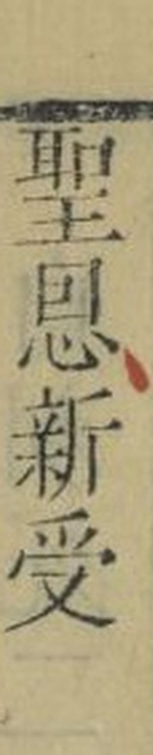聖㤙新受
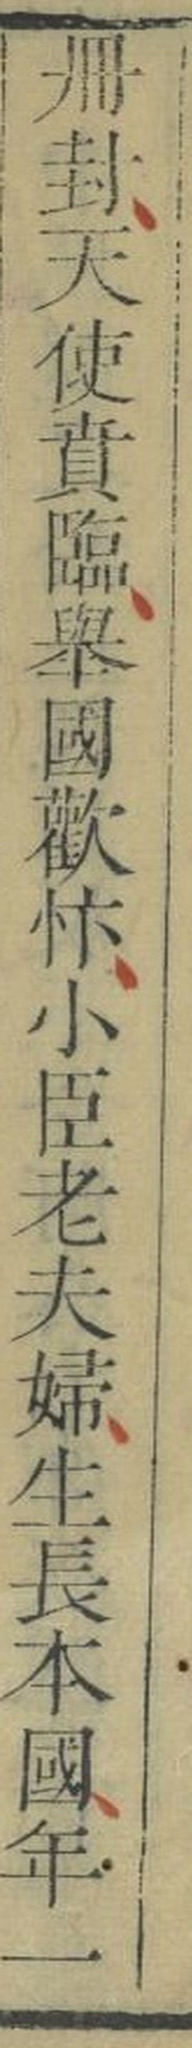冊封天使賁臨擧國歡忭小臣老夫婦生長本國年一
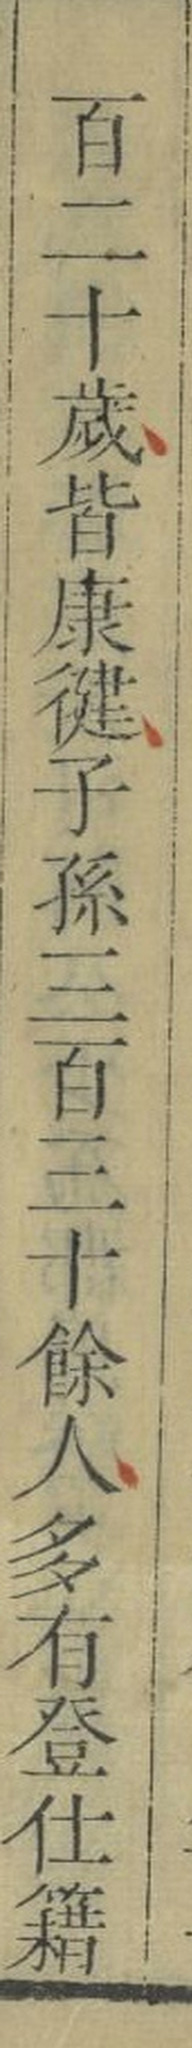百二十歲皆康徤子孫三百三十餘人多有登仕籍
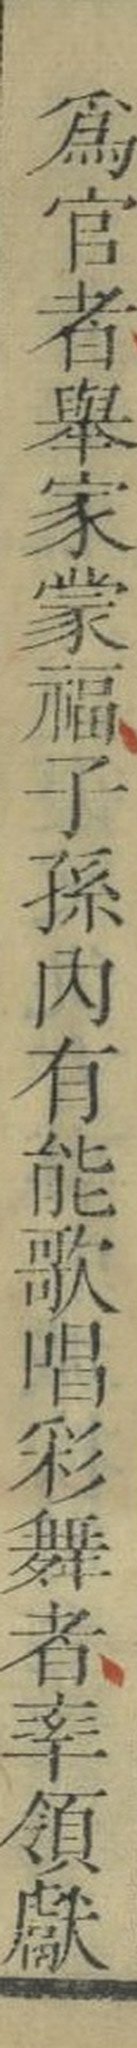爲官者擧家蒙福子孫内有能歌唱彩舞者率領獻
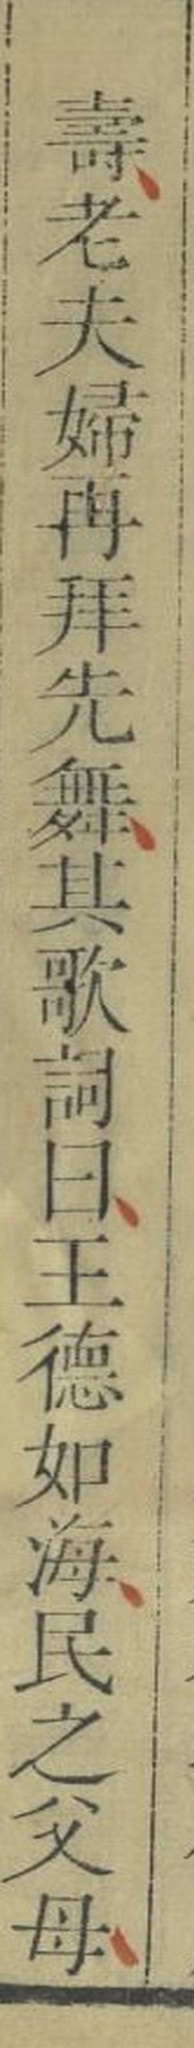壽老夫婦再拜先舞其歌詞曰王德如海民之父母
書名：中山伝信録 巻一、巻二
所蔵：University of the Ryukyus Library
